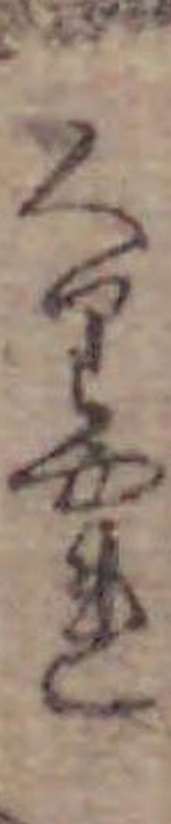くりやれ
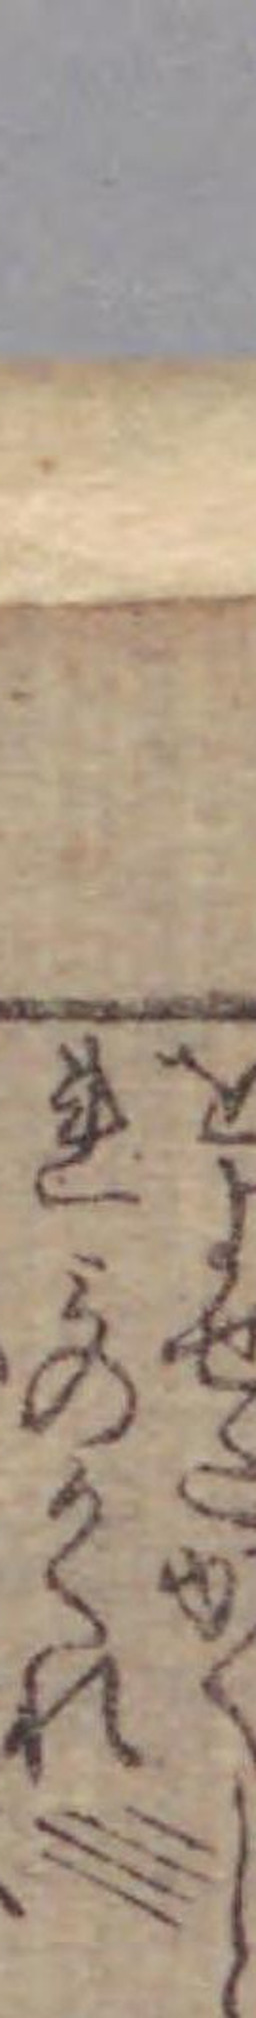れみのかくれ
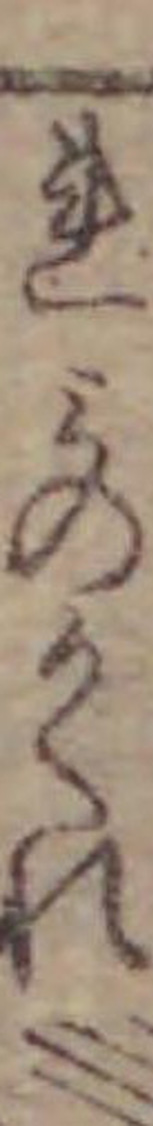れみのかくれ
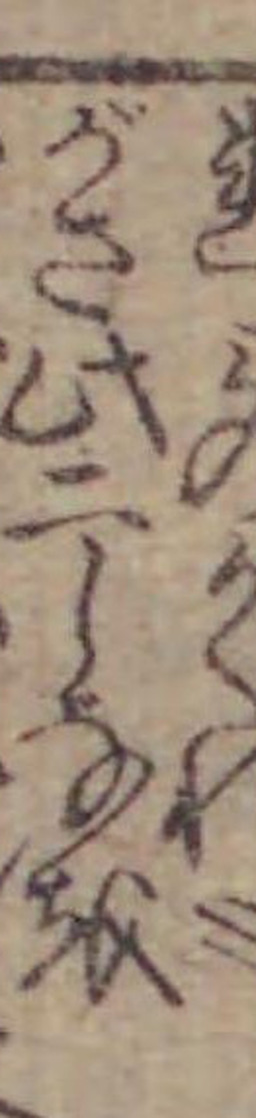がさ此二しなを
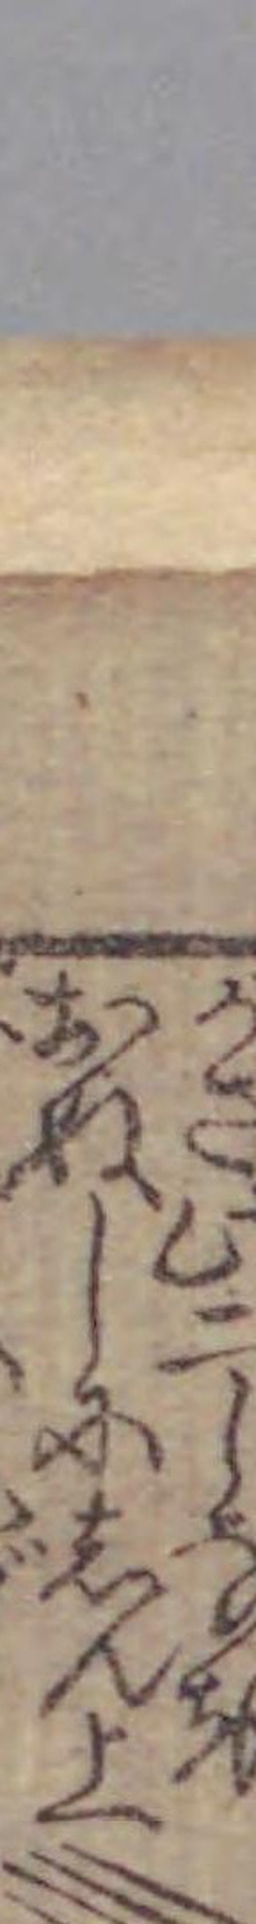おぬしにしん上
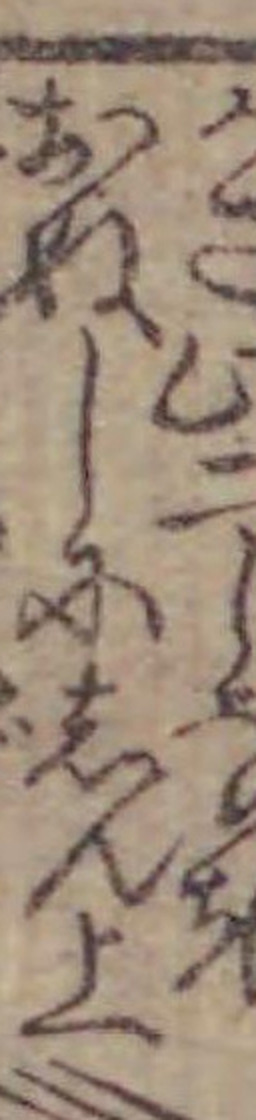おぬしにしん上
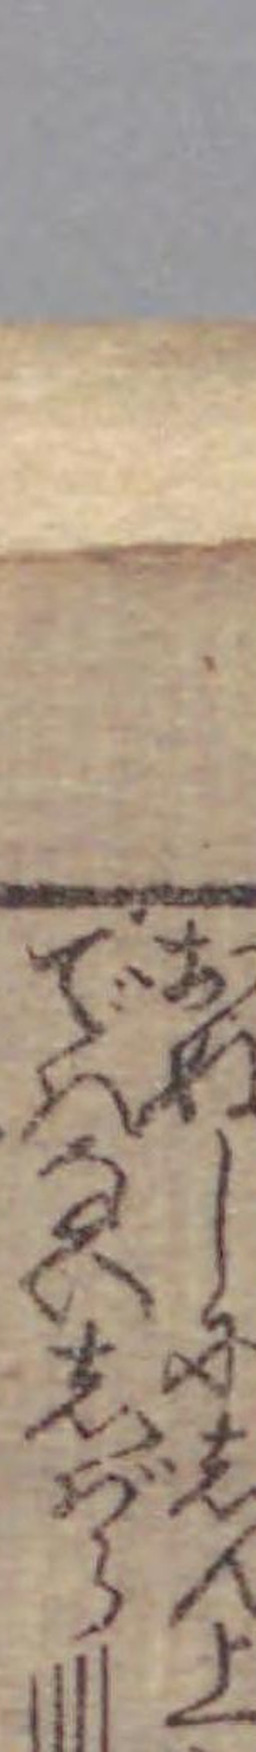ではないしばらく
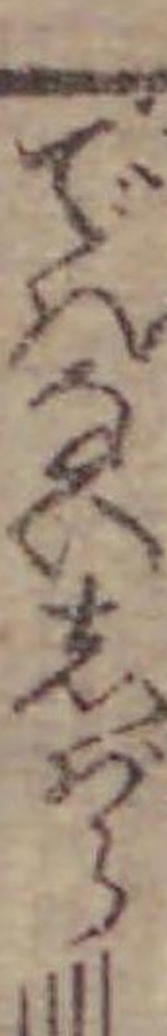ではないしばらく
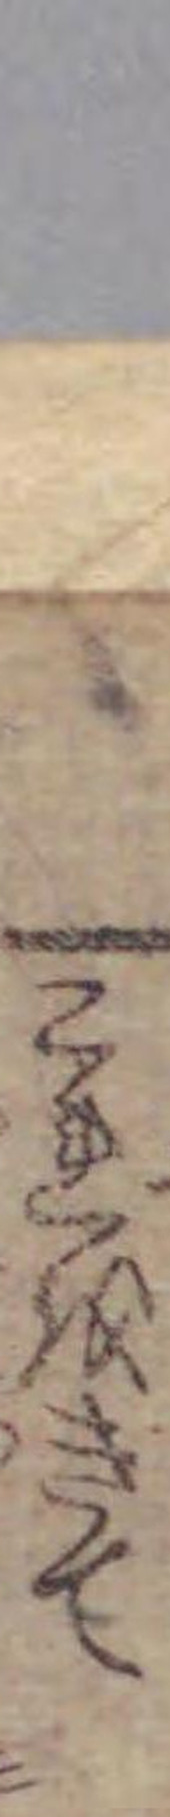これをきて
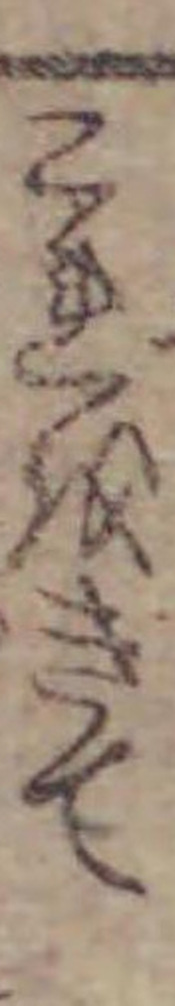これをきて
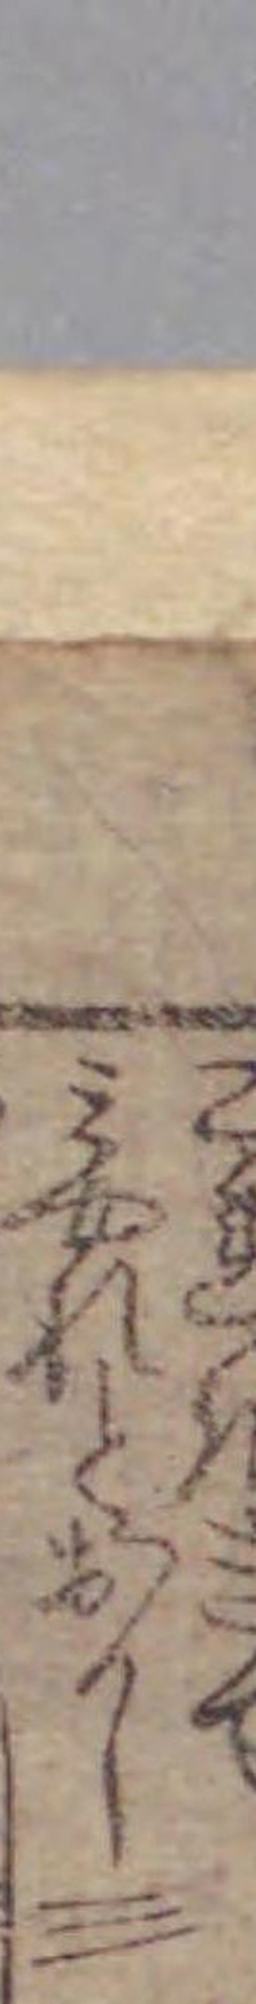みやれとおかし
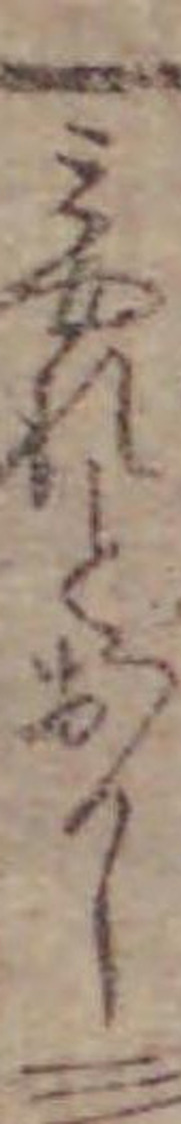みやれとおかし
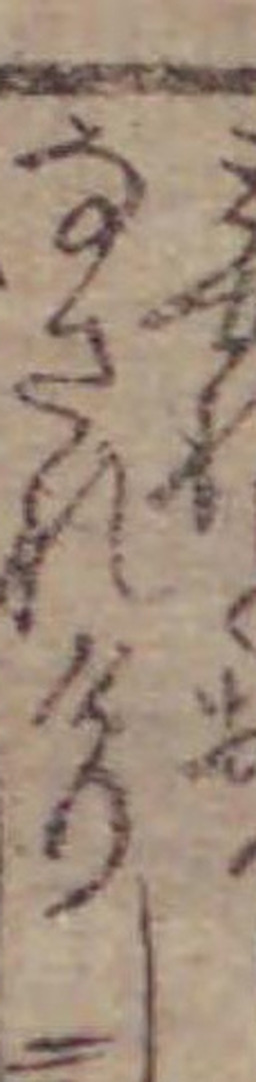なされけり
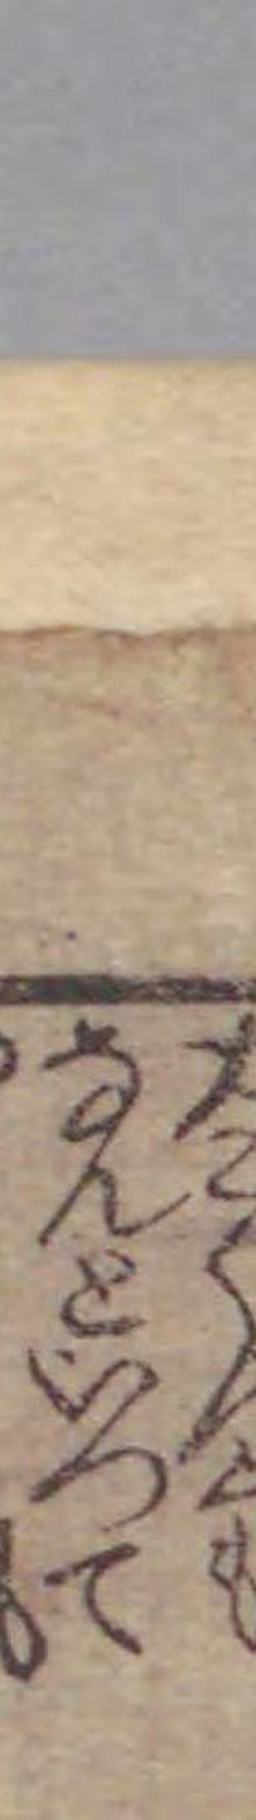なんといつても
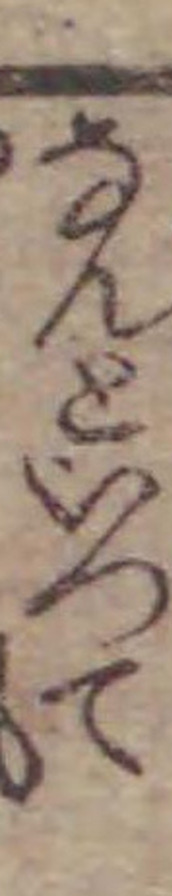なんといつても
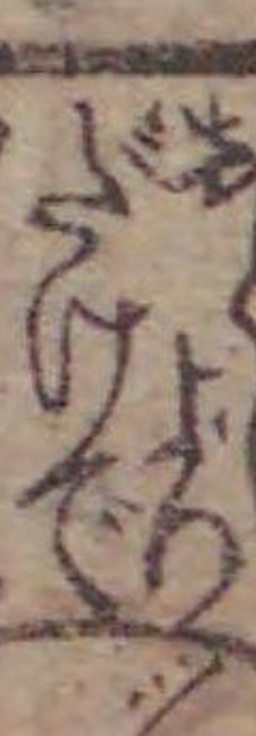だけで
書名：即席耳学問 : 3巻
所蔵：国立国会図書館 National Diet Library, JAPAN
